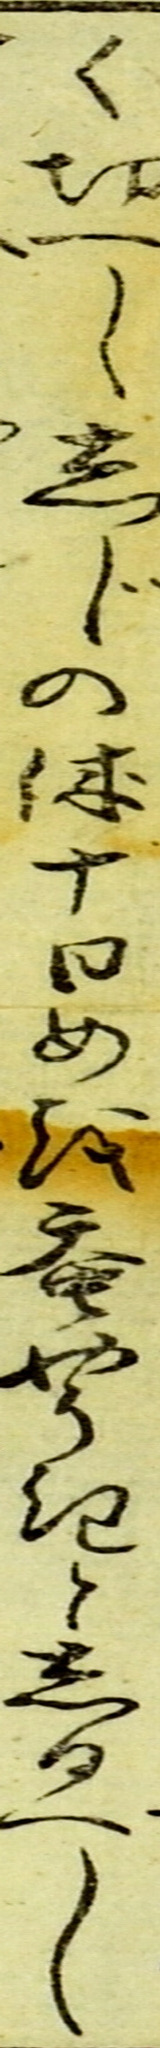く切へししじの休十日めを蚕やうきとしるへし
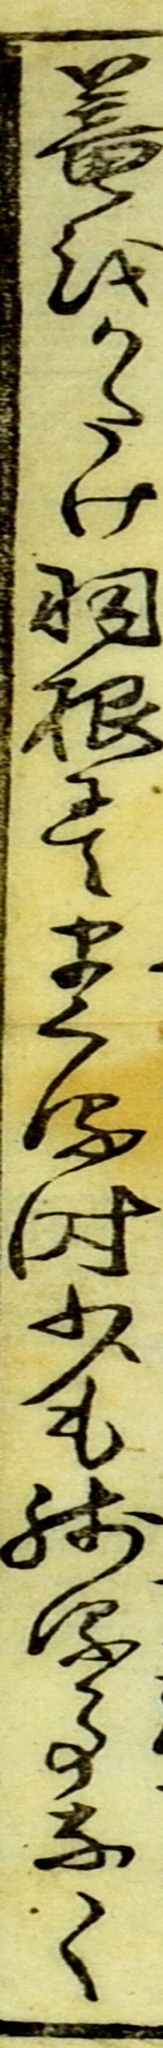籠をかたけ羽根にてまくるとき少も残る事なく
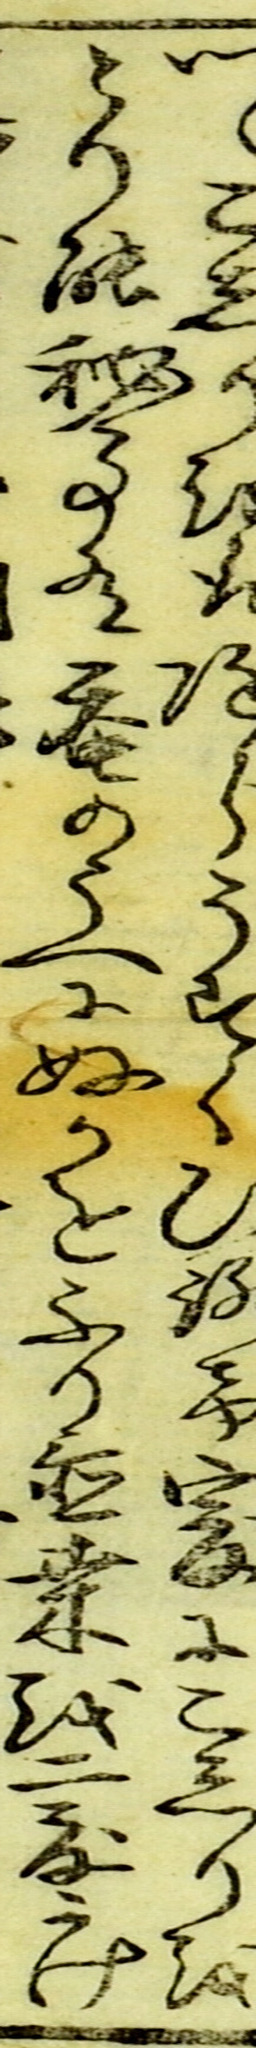とり能秘事有蚕のうへにぬかをふり置桑を二度かけ
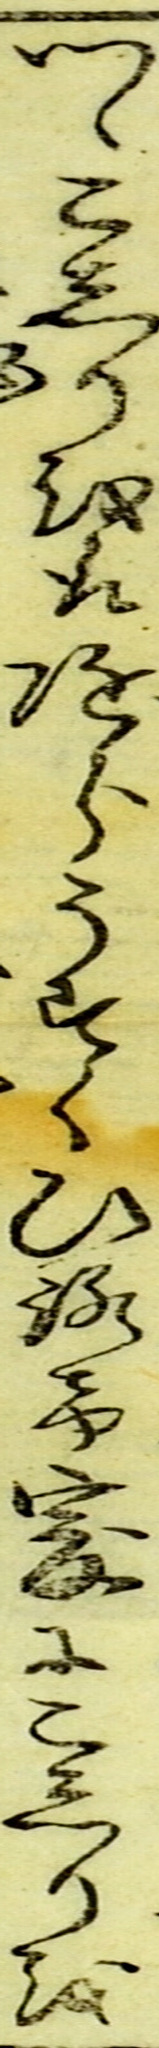ツヽこしりを取随分うすくひろけ爰にこしりを
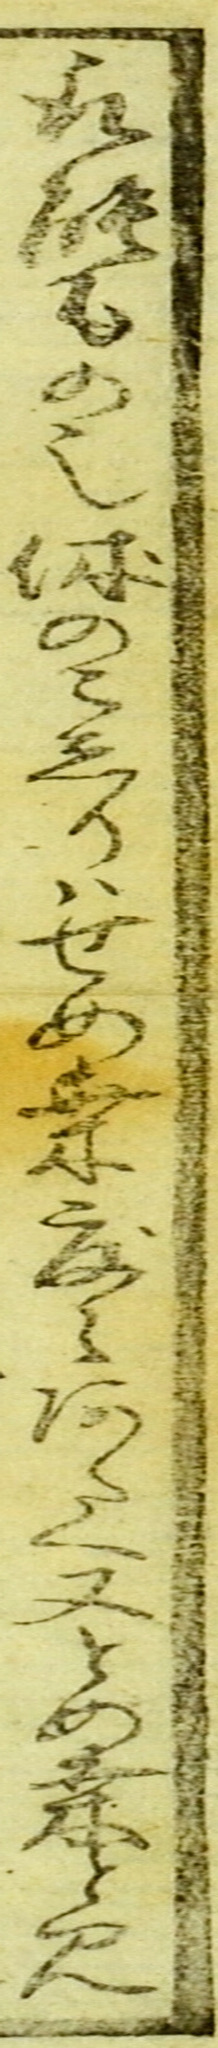取能もの也休のこしりはせめ桑度々あたへ又とめ桑と見
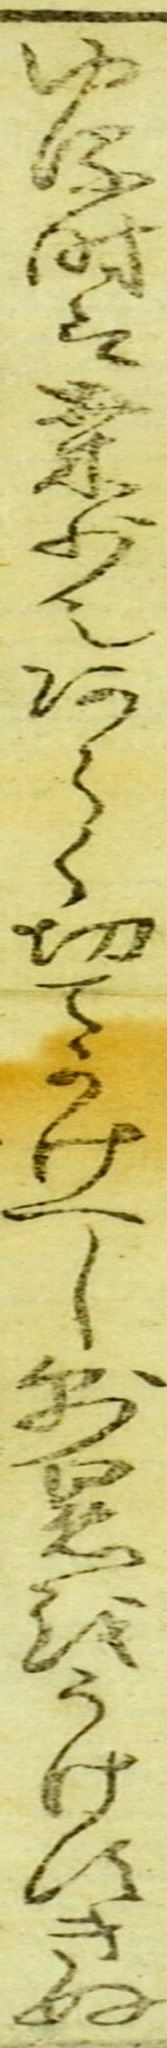ゆる時は桑少しあらく切てかけへし則暑をうけすきぬ
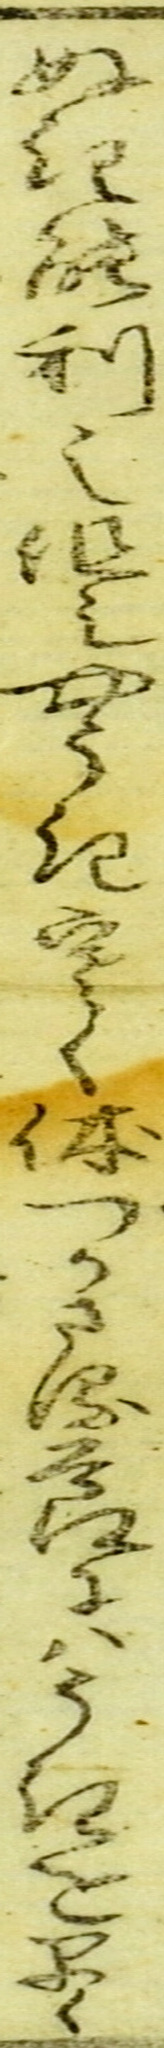ぬき能利也但しやうき寒く休みつかさる節にはうきを早く
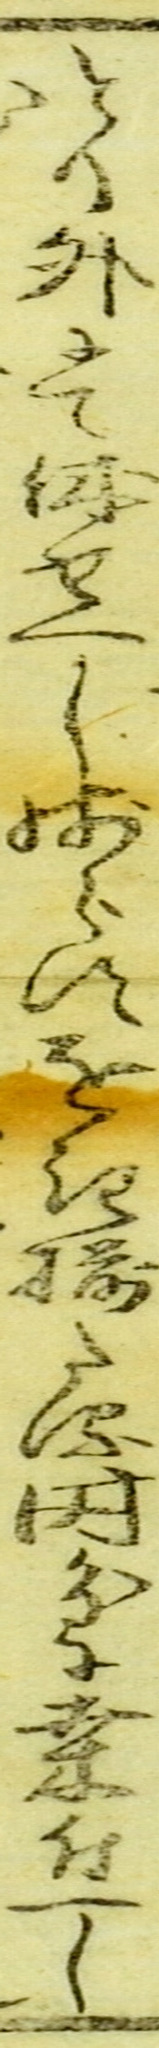とり外にて休せへし残らすをき揃たる時分に桑付へし
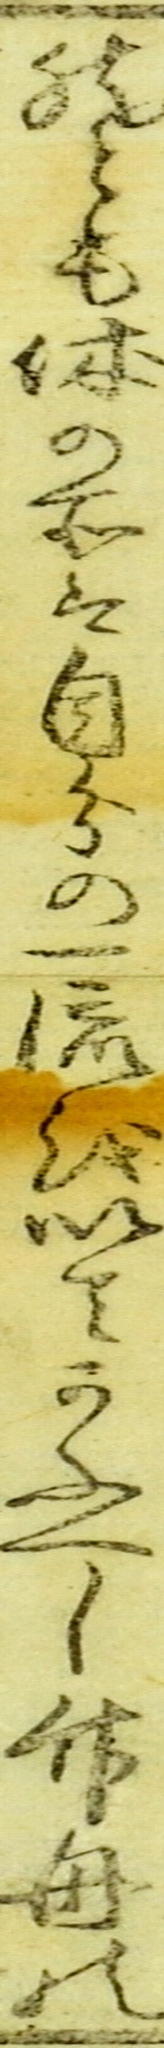然とも休の所は自分の一流を以てかふへし竹舟の
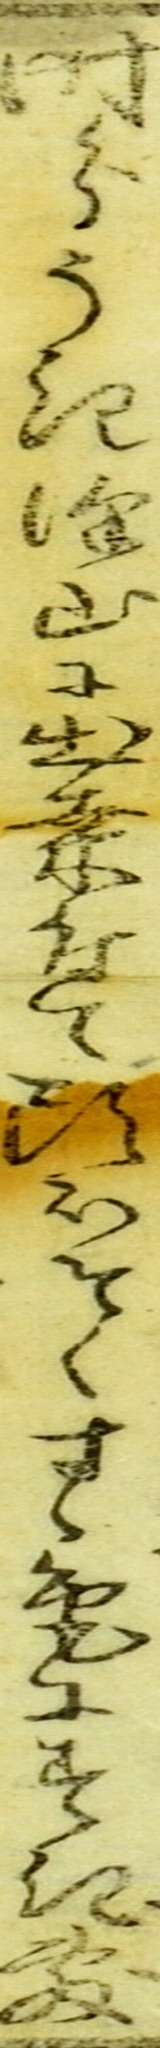時分うき沢山に出桑付て頭ほそくすゝ色にすき敷
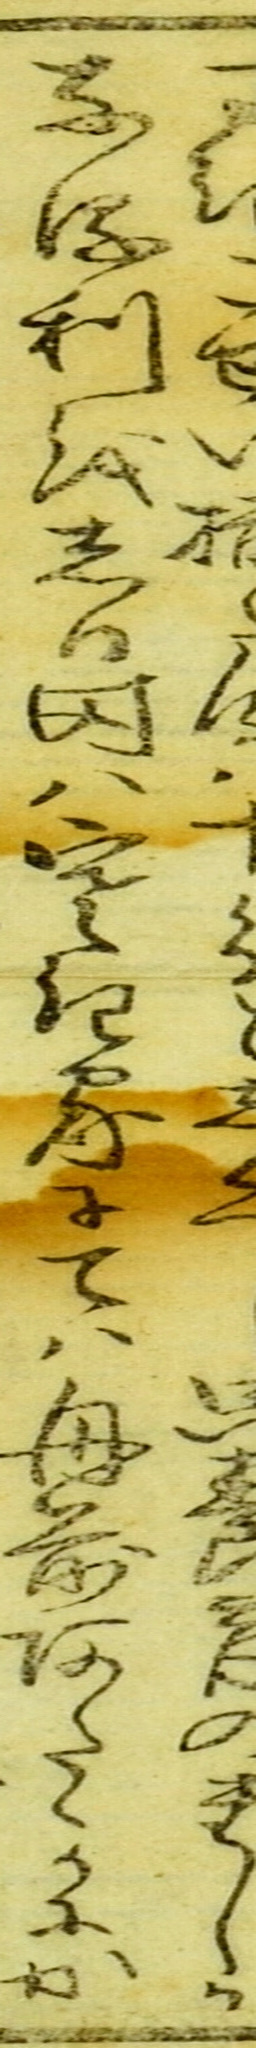なる利をしる時は寒き家にては舟前あたゝかにか
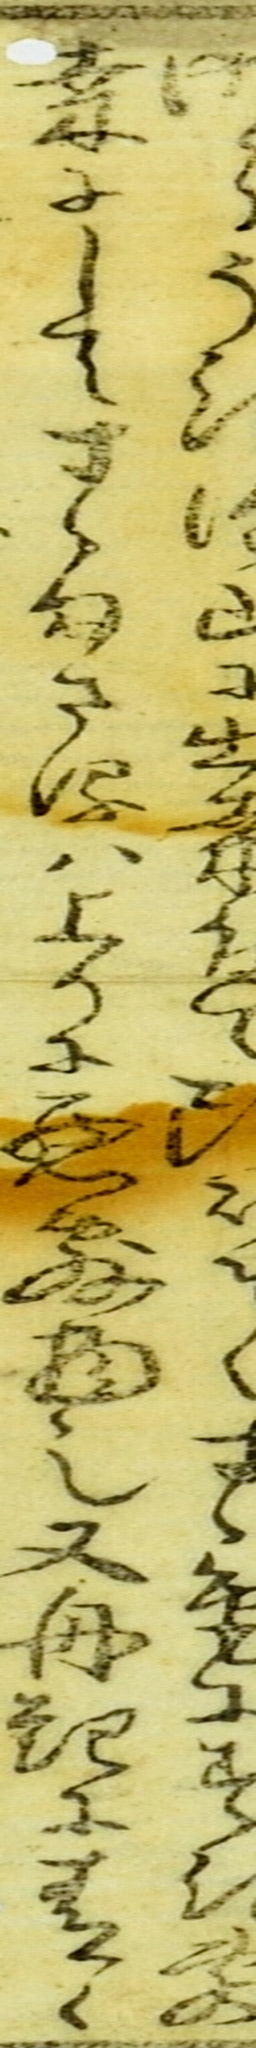桑にしてすゝまさるは上りに悪敷物也又舟起に青く
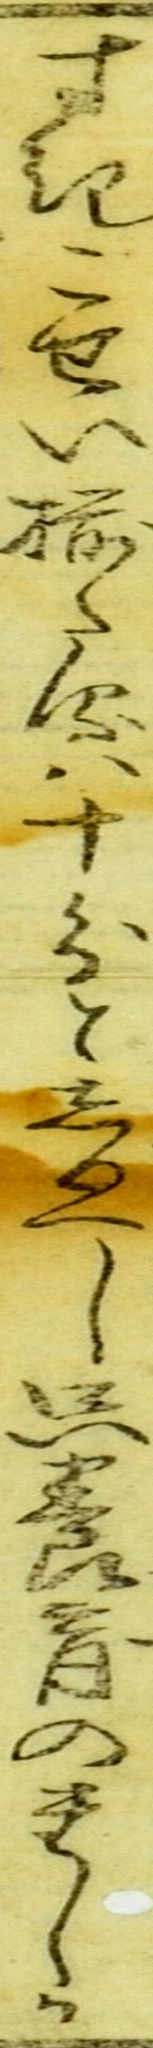すきこせい揃たるは十分としるへし只養育のたしか
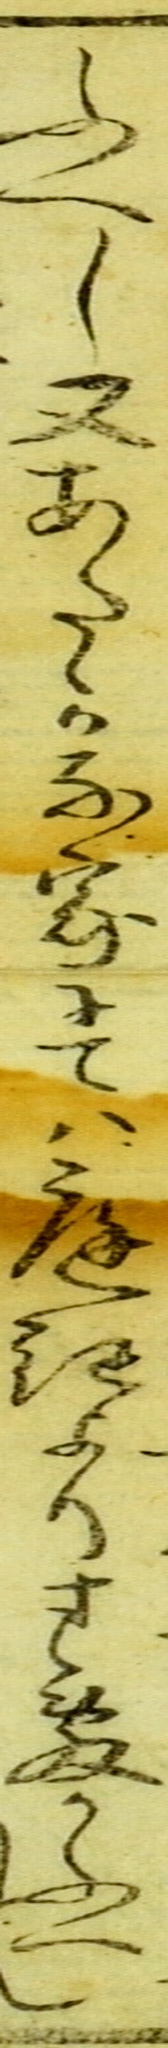ふへし又あたゝかな家にては庭起よりすゝ敷かふへし
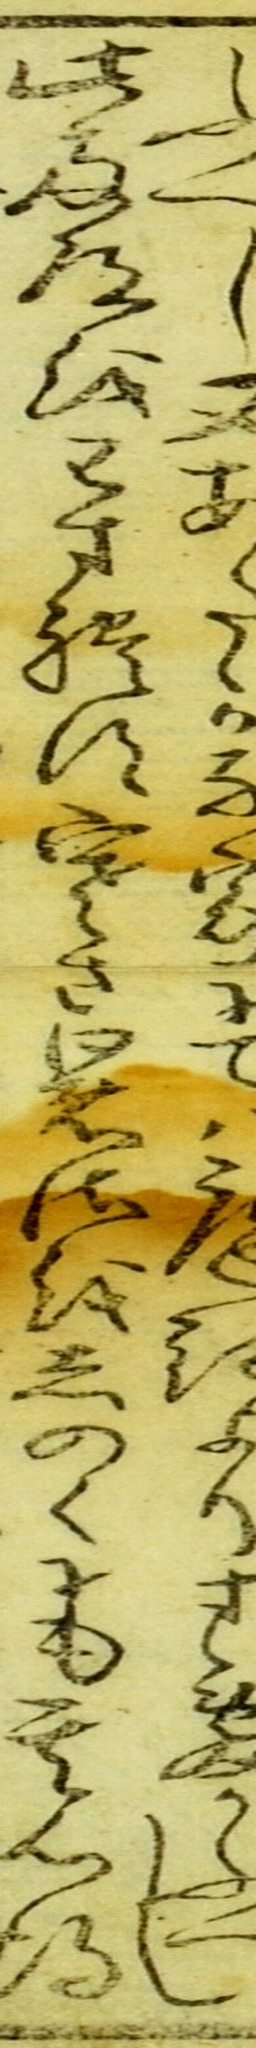此両道をわすれす寒さ暑さをしのくにも其心得
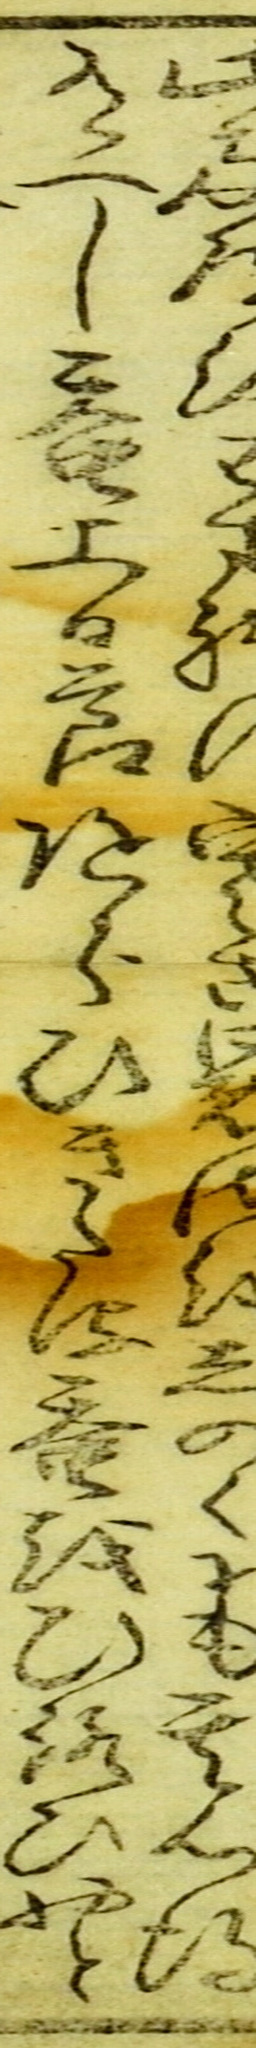有へし蚕上る節随分ひきたる蚕をひろひ物初と
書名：覚
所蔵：伊那市立高遠町図書館・合同会社AMANE
